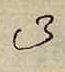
3
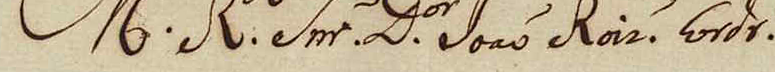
M.to R.do Snr̄. D.or Ioaõ Roiz̄. Cordr.o
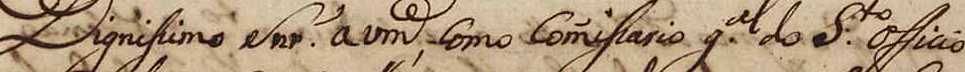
Dignissimo Snr̄. a vmce, como Com̄issario g.al do S.to officio
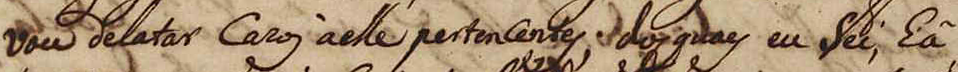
vou delatar Cazos à elle pertencentes; dos quaes eu Sei, há
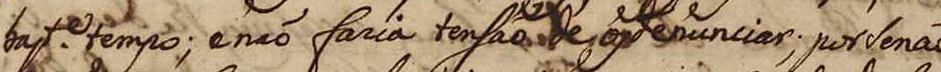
bast.e tempo; e naõ fazia tensaõ de os denunciar; por senaõ
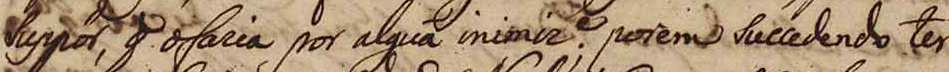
Suppor, q̄ o fazia por alguā inimiz.e porem succedendo ter
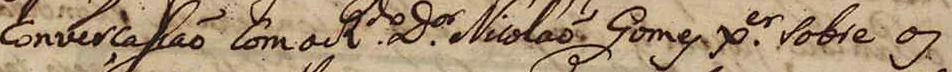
converçassaõ com o R.do D.or Nicolaó Gomes x.er sobre os
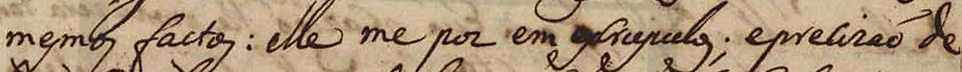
mesmos factos: elle me poz em exCrupulos; e precizaõ de
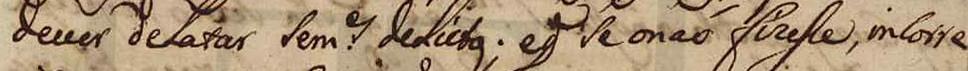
deuer deLatar sem.es deLictos; e q̄ se o naõ fizesse, incorre
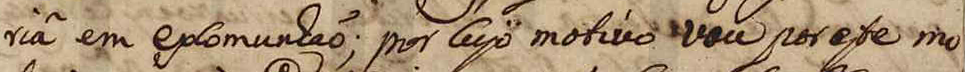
riã em excomunhaõ; por cujo motivo vou por este mo
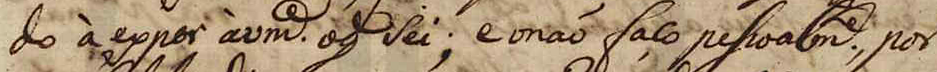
do à expor à vm.ce o q̄ sei; e o naõ faço pessoalm.te, por
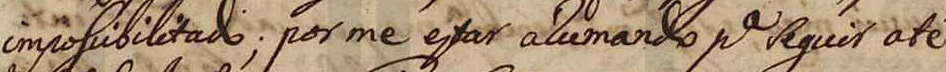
impossibilitado; por me estar aRumando pa seguir até
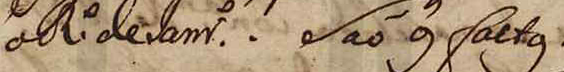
o R.o de Ianr.o .Saõ os factos.
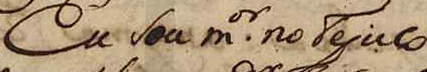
Eu sou m.or no Tejuco
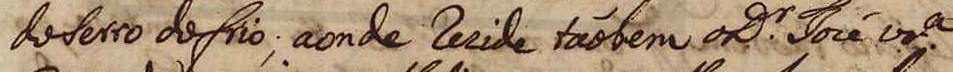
do Serro do frio; aonde Rezide taõbem o D.r Iozé vr.a
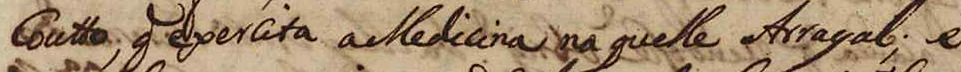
Coutto, q̄ exercita a Medicina naquelle Arrayal; e
